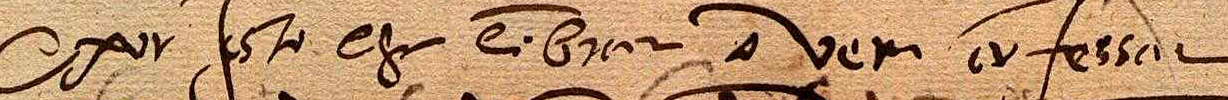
e por Jsto lhe lēbrar o vem cōfessar
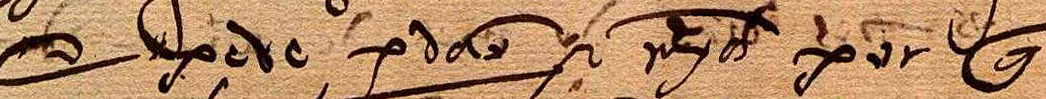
e pede ꝑdaõ e mȳa porq̄
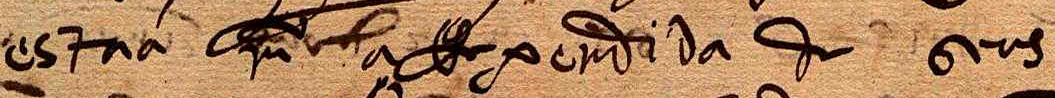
estaá mto aRependida de seus
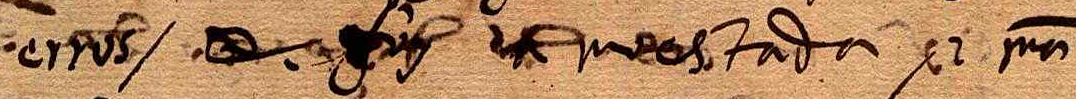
erros / e foy amoestada e mā
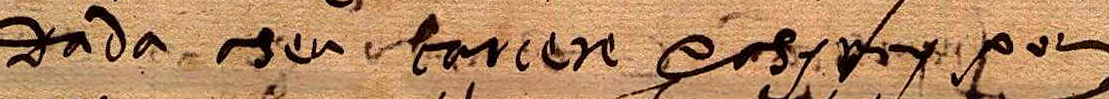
dada a seu carcere e asyney por
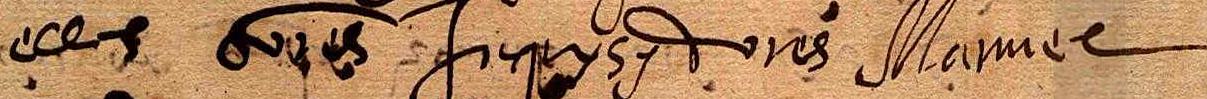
elles sōres Jnquysydores Manuel
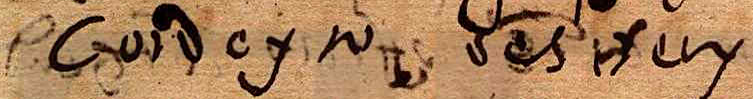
Cordeyro o escreuy
